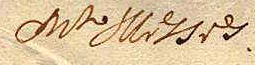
Mto Illres Sres
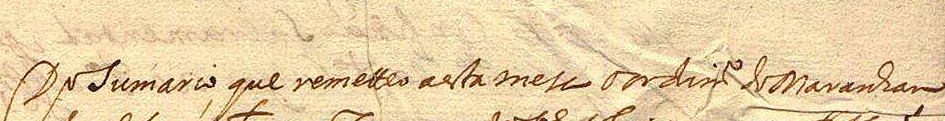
Do Sumario, que remetteo a esta mesa o ordinro do Maranham
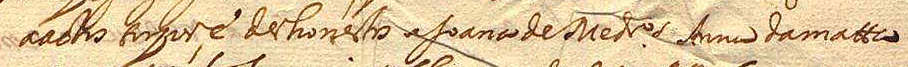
a actos torpes, e deshonestos a Joana de Medr.os Anna da matta
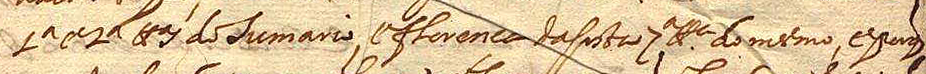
1a e 2a tt.as do Sumario, e florença da Costa 7a tt.a do mesmo, e porq̄
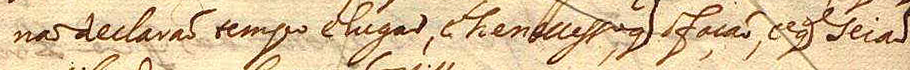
naõ declaraõ tempo e lugar, e he neccesso, q̄ façaõ, e q̄ seiaõ
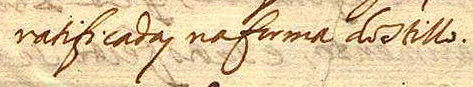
ratificadas na forma do stillo.
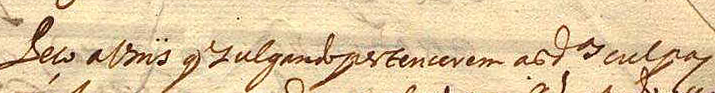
Peço a v ms̄ q̄ julgando pertencerem as das culpas
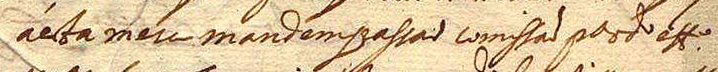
a esta meza mandem passar comissaõ pa o do eff.o
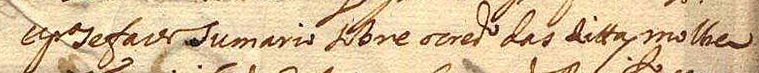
e pa se fazer Sumario sobre o credo das dittas molhe
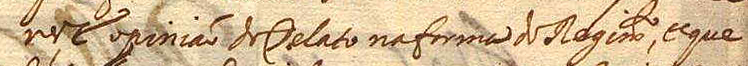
res e opiniaõ do Delato na forma do Regimto, e que
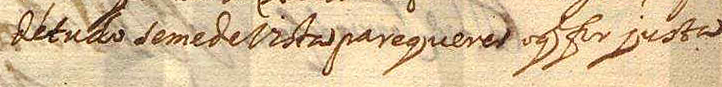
de tudo se me de vista pa requerer o q̄ for justa
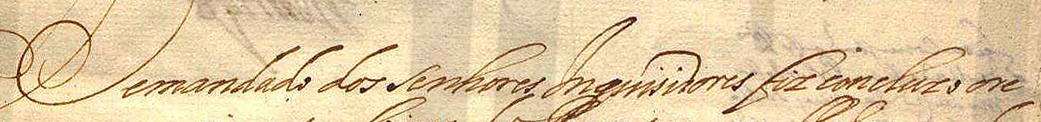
De mandado dos Senhores Inquisidores fiz concluzo o re
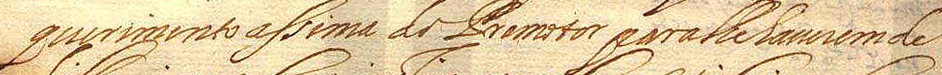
querimento assima do Promotor para lhe hauerem de
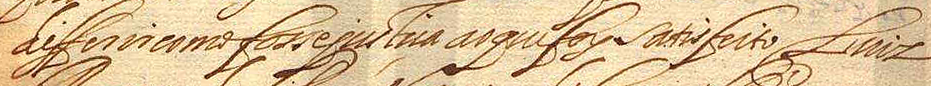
differir como fosse justiça ao que foy satisfeito, Luiz
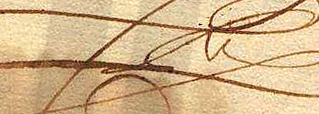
Clo
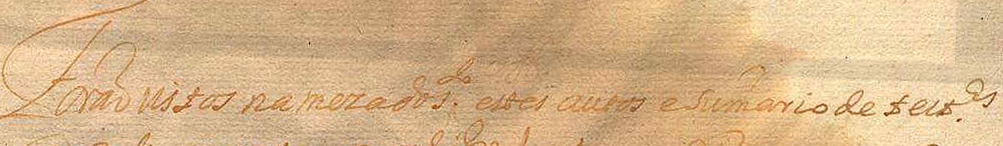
Foraõ uistos na meza do s.to estes autos e sumario de test.as
